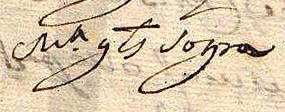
M.a gl̄s sogra
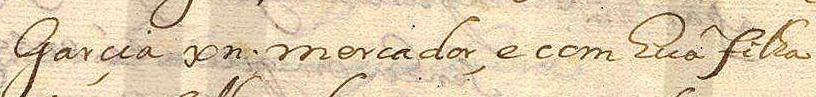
Garcia x n. mercador, e com huā filha
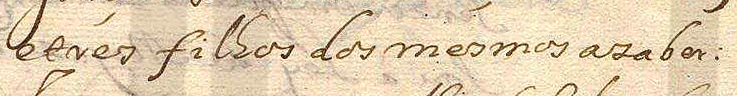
e tres filhos dos mesmos a saber:
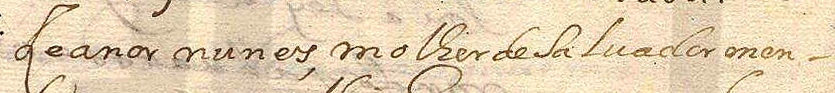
Leanor nunes, molher de Saluador men
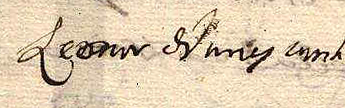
Leonor Nunes cunh
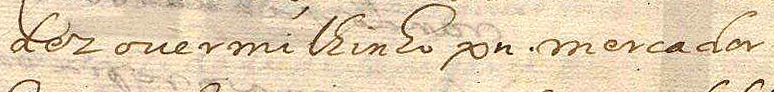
dez o uermilhinho xn. mercador
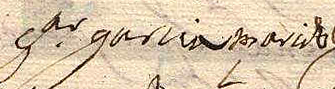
g.ar garcia marido
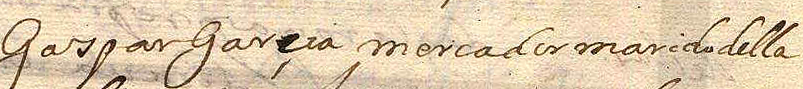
Gaspar Garcia, mercador marido della
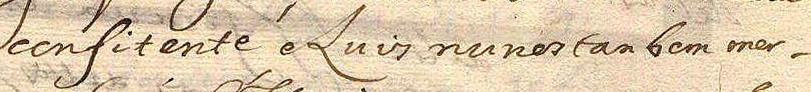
confitente e Luis nunes tambem mer
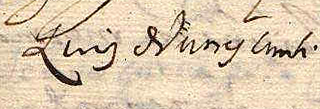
Luis Nunes Cunh.
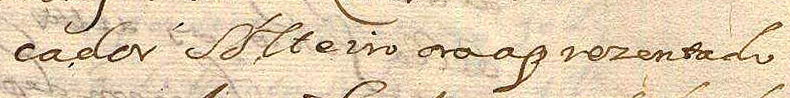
cador solteiro ora aprezentado
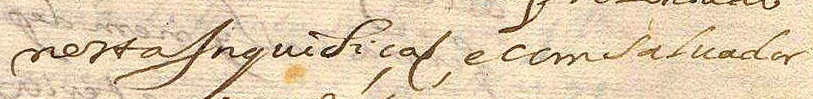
nesta Jnquisiçaõ, e com saluador
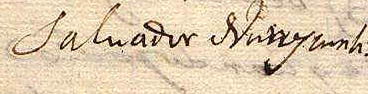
Saluador Nunes cunh.
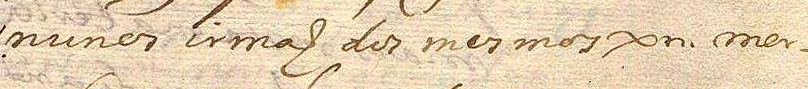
nunes irmaõ dos mesmos xn. mer
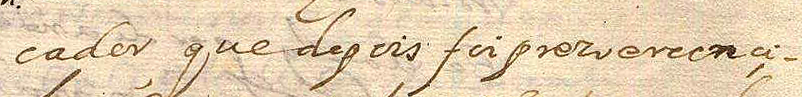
cador, que depois foi prezo e reconci
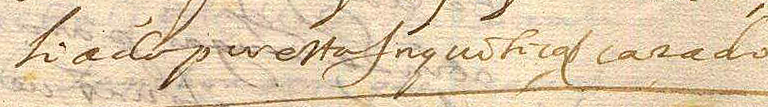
liado por esta Jnquisiçaõ cazado
